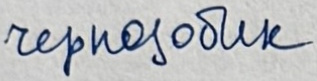чернозобик
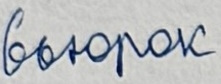вьюрок
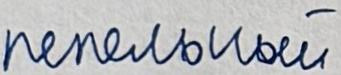пепельный
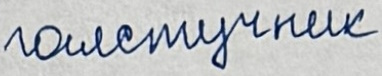галстучник
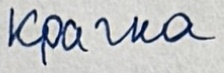крачка
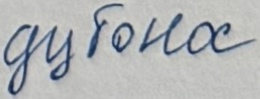дубонос
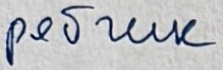рябчик
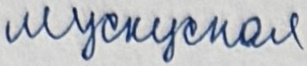мускусная
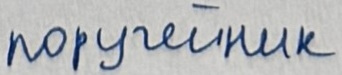поручейник
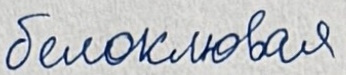белоклювая
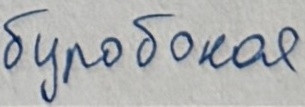булобокая
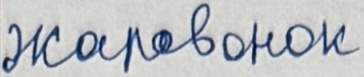жаровонок
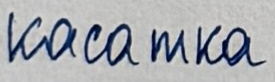касатка
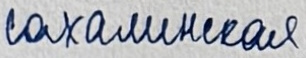сахалинская
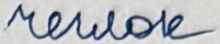чеглок
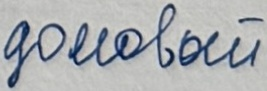домовый
